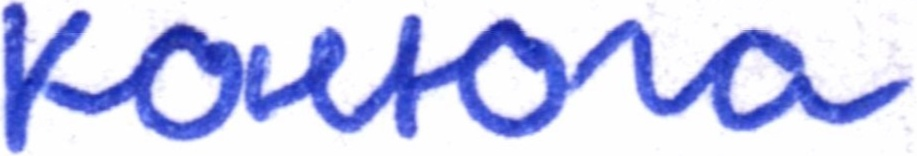конюга
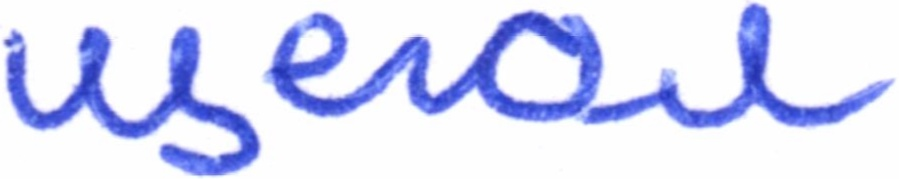щегол
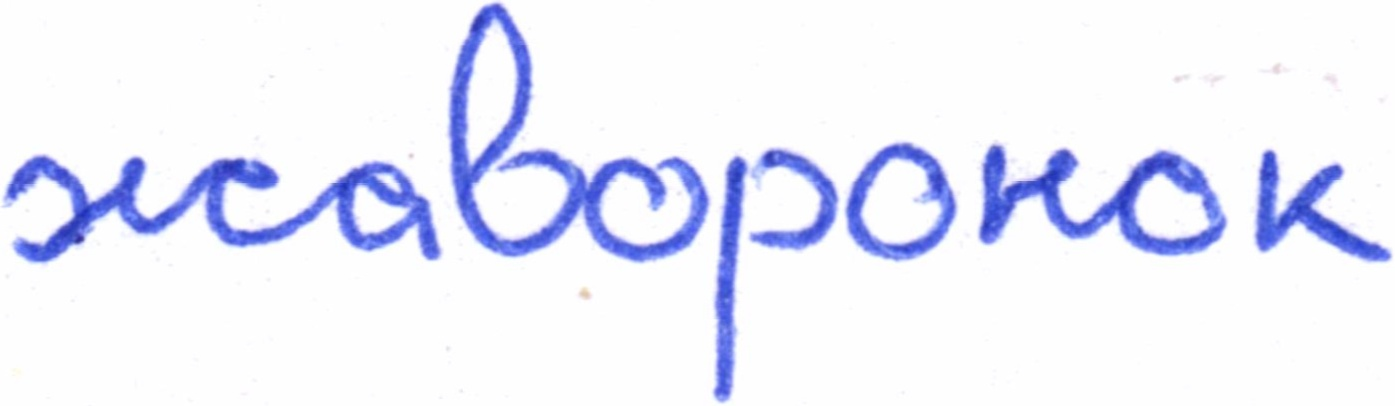жаворонок
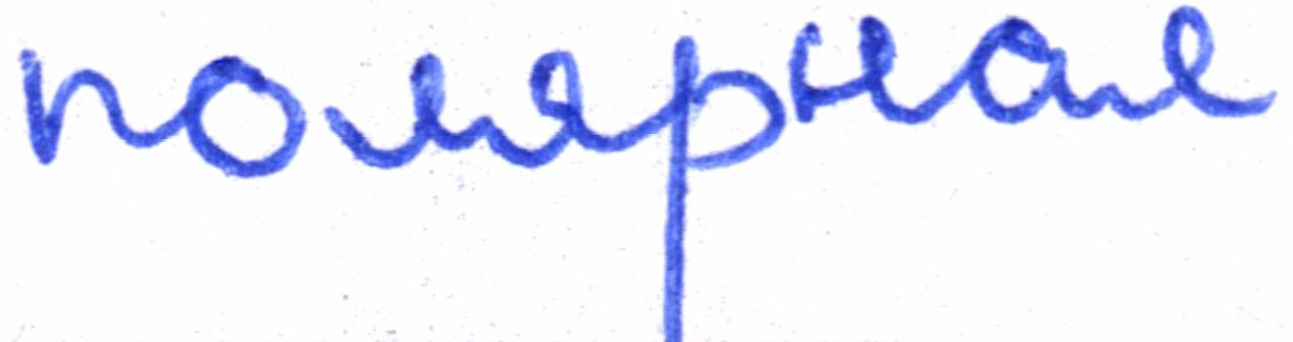полярная
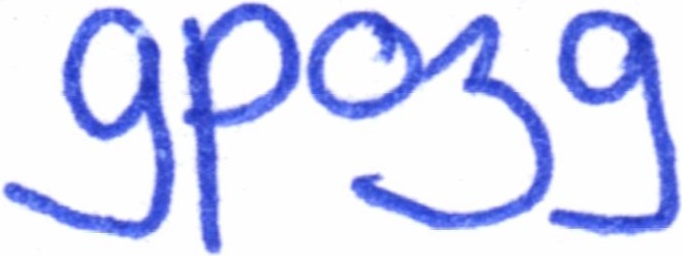дрозд
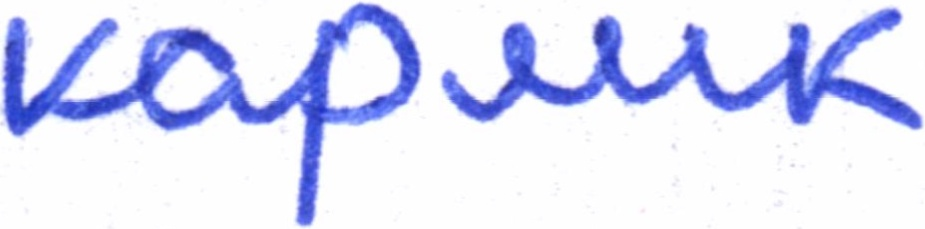карлик
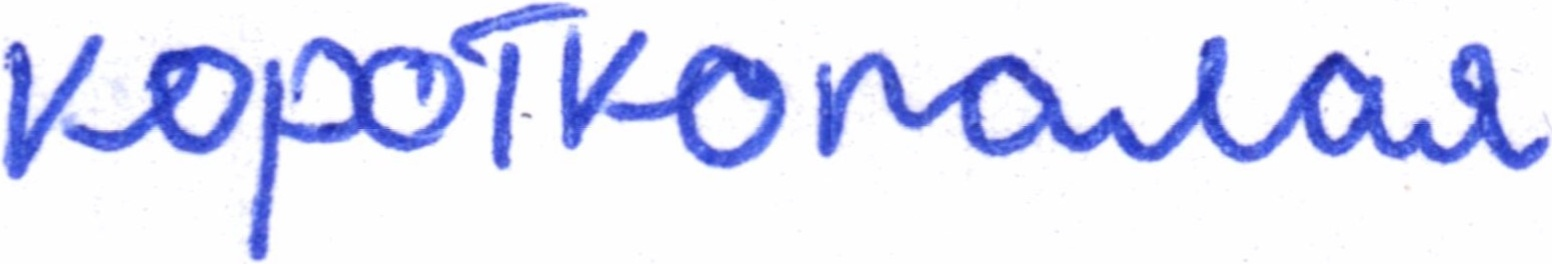короткопалая
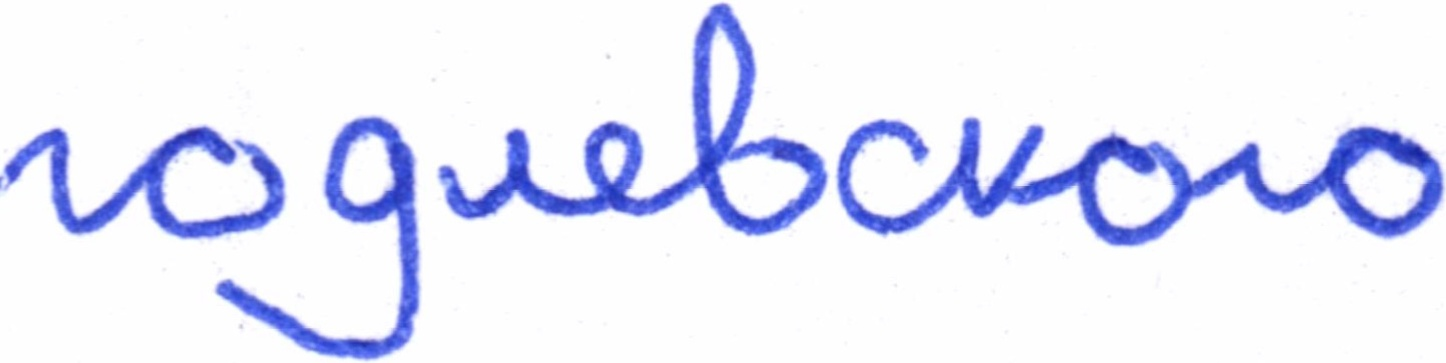годлевского
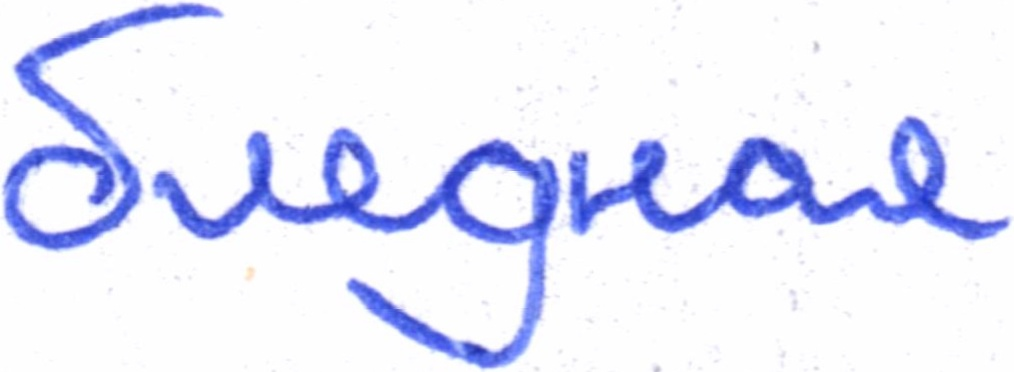бледная
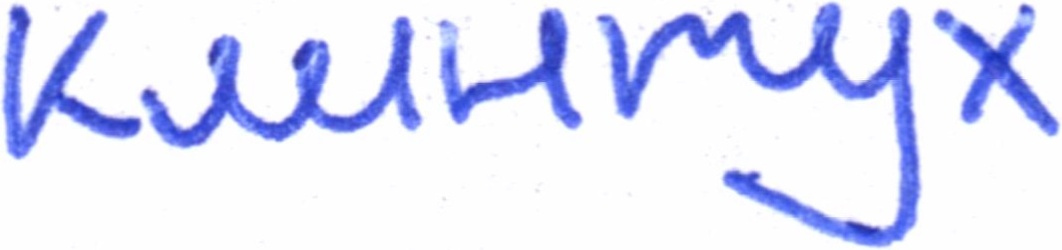клинтух
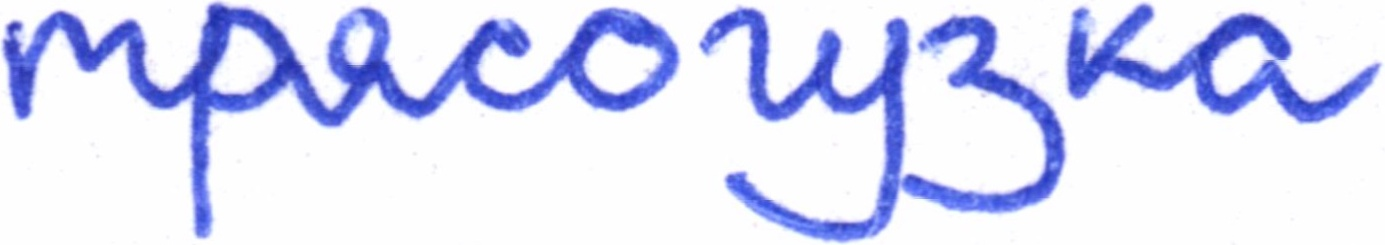трясогузка
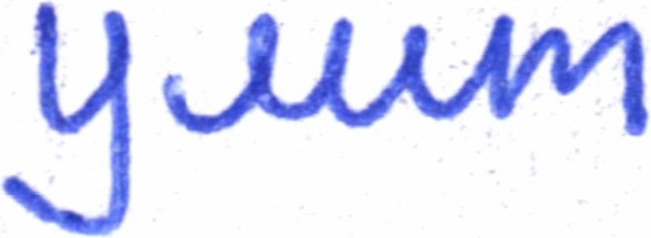улит
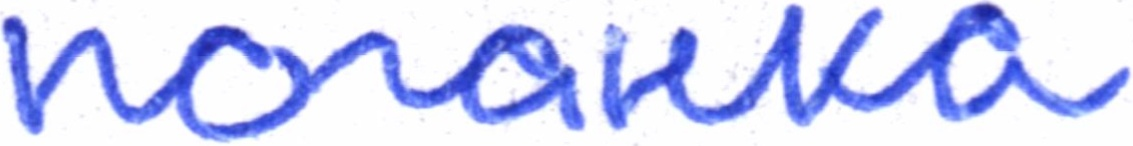поганка
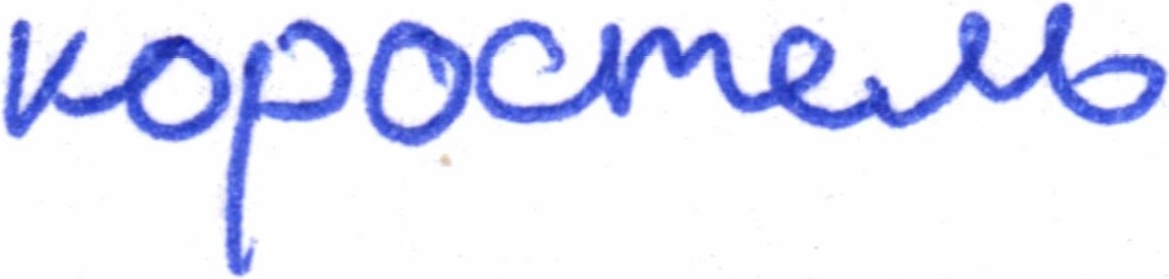коростель
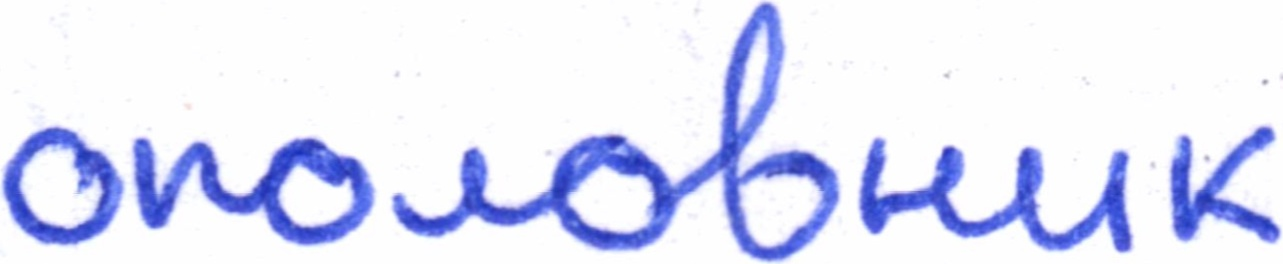ополовник
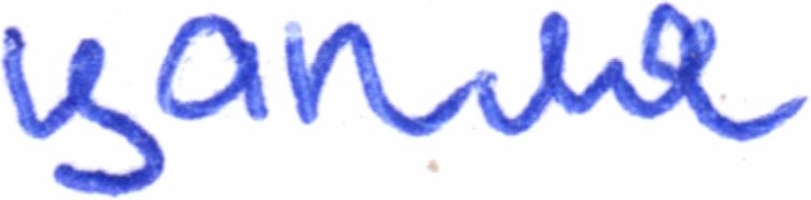цапля
